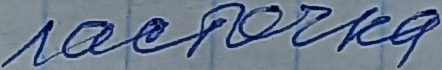ласточка
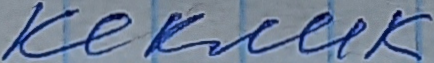кеклик
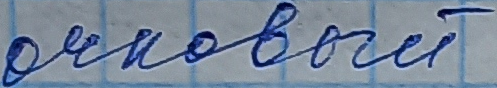очковый
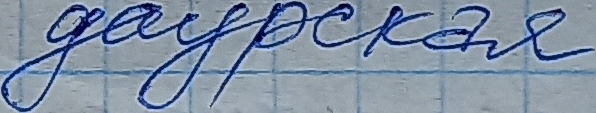даурская
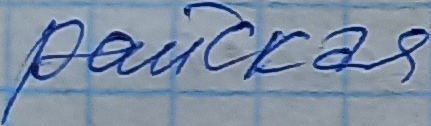райская
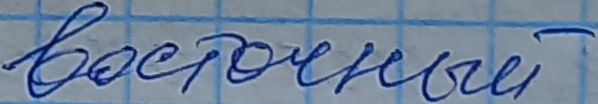восточный
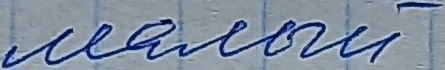малый
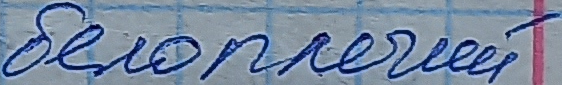белоплечий
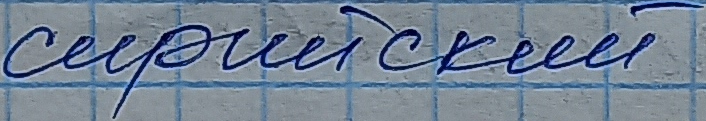сирийский
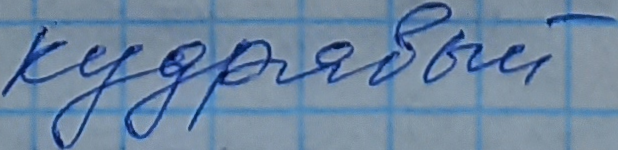кудрявый
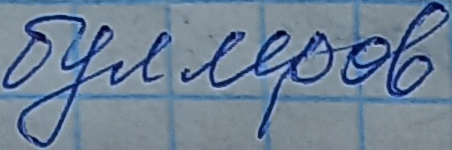буллеров
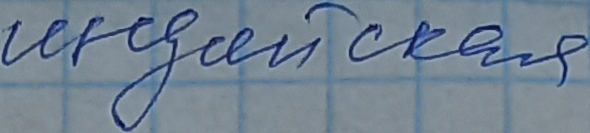индийская
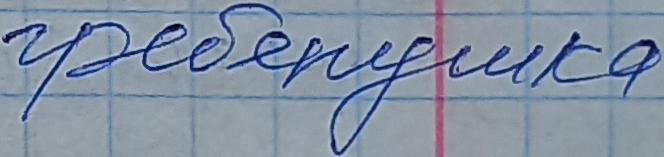гребенушка
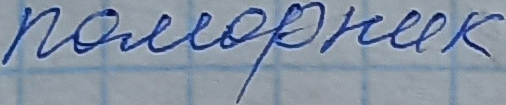поморник
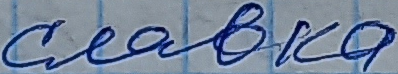славка
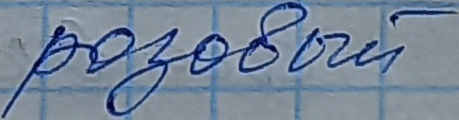розовый
